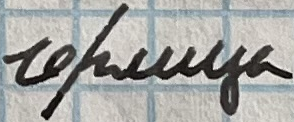горлица
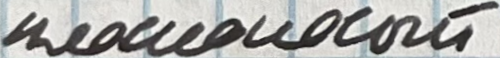плосконосый
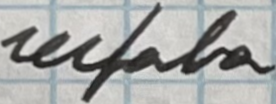чеграва
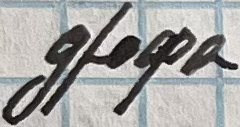дрофа
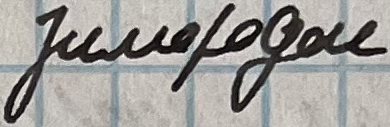зимородок
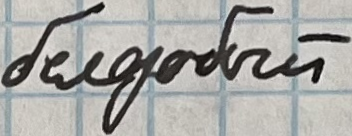белозобый
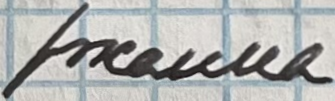ржанка
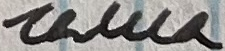галка
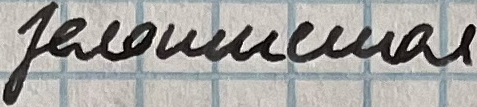зелотистая
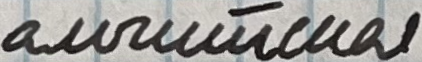альпийская
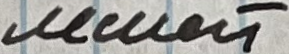лесной
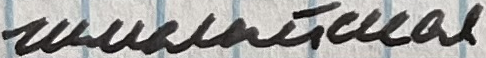гималайская
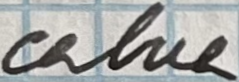савка
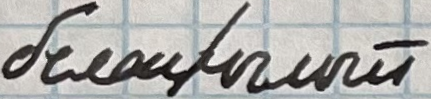белокрылый
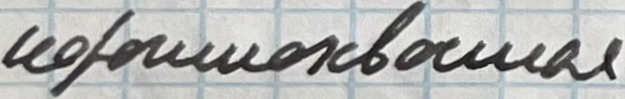короткохвостая
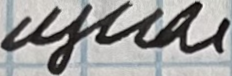щегол
